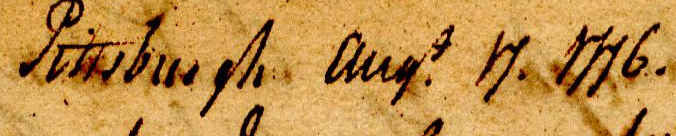Pittsburgh Aug^t. 17. 1776.
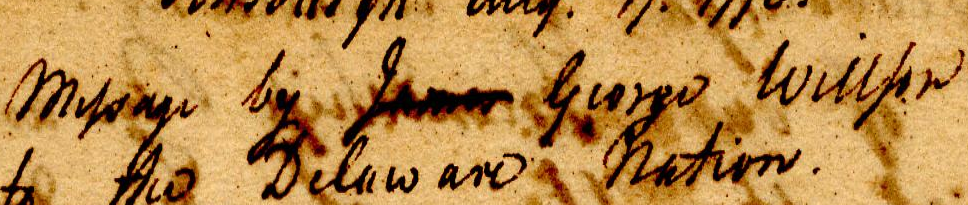Message by James George Willson
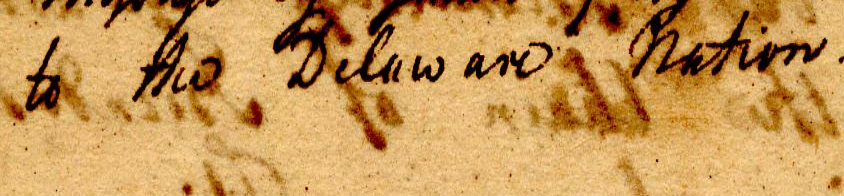to the Delaware Nation.
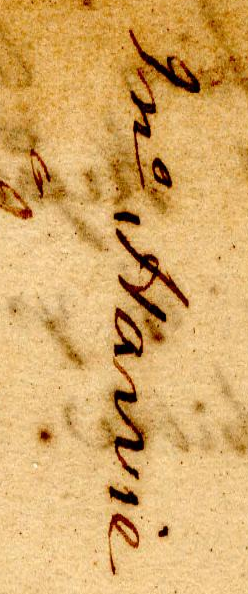Jn^o Harvie
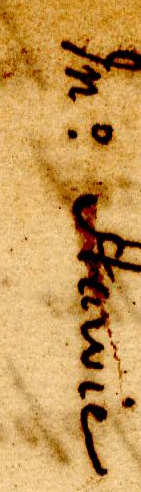Jn^o. Harvie
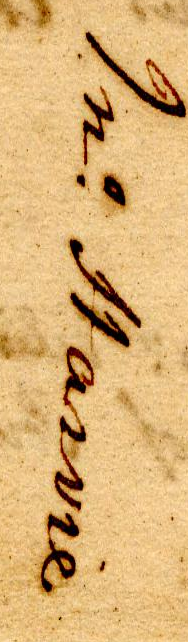Jn^o. Harvie
